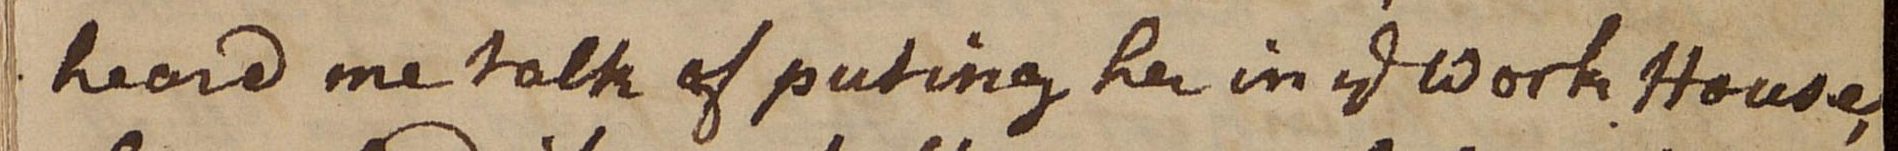heard me talk of puting her in y^e Work House,
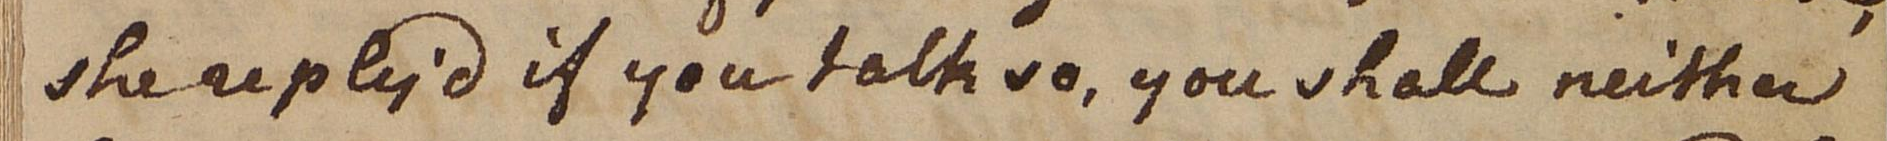she reply'd if you talk so, you shall neither
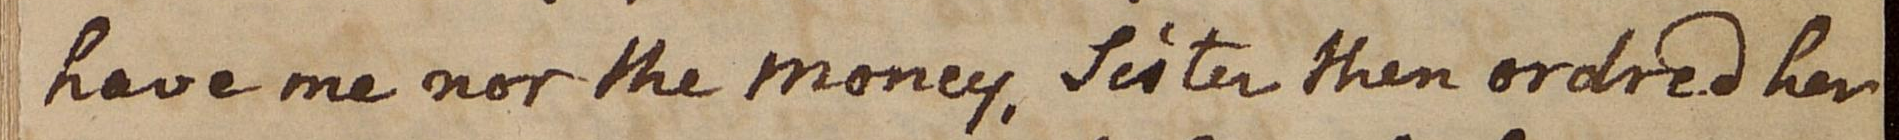have me nor the money, Sister then ordred her
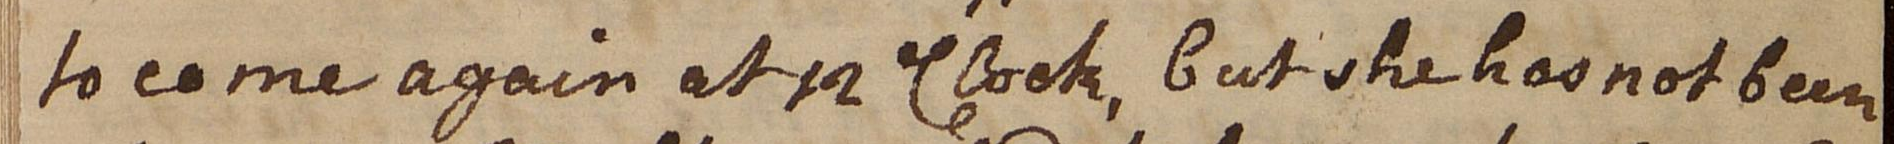to come again at 12 ^oClock, but she has not been
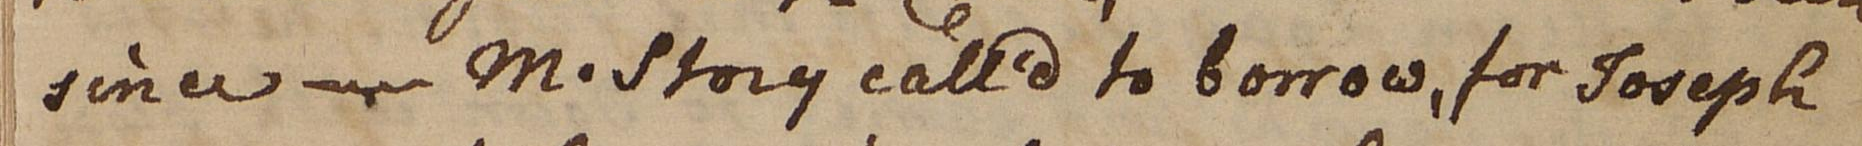since- M. Story call'd to borrow, for Joseph
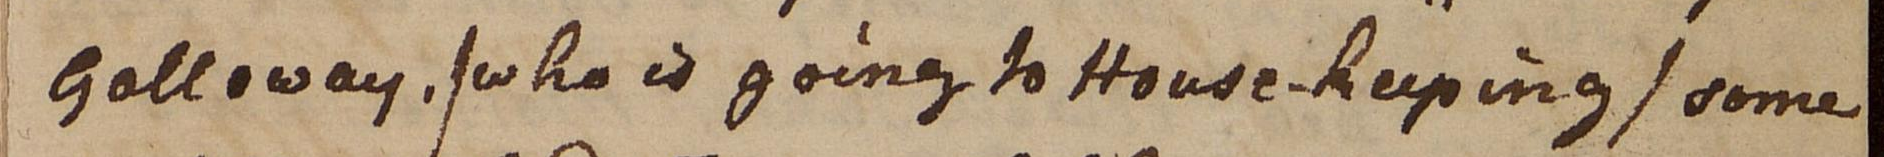Galloway, /who is going to House-keeping/ some
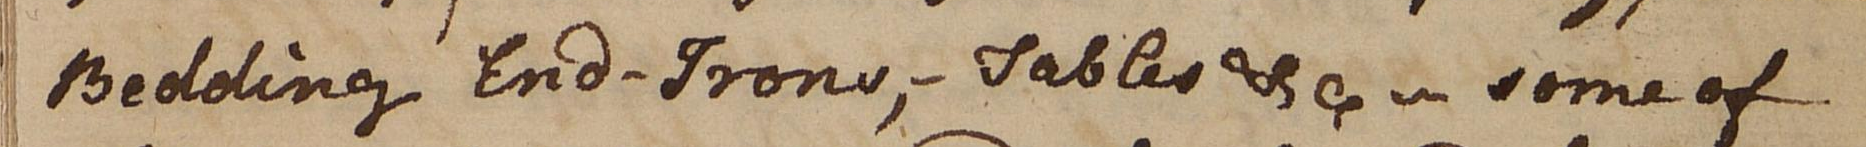Bedding End- Irons,-Tables &c- some of
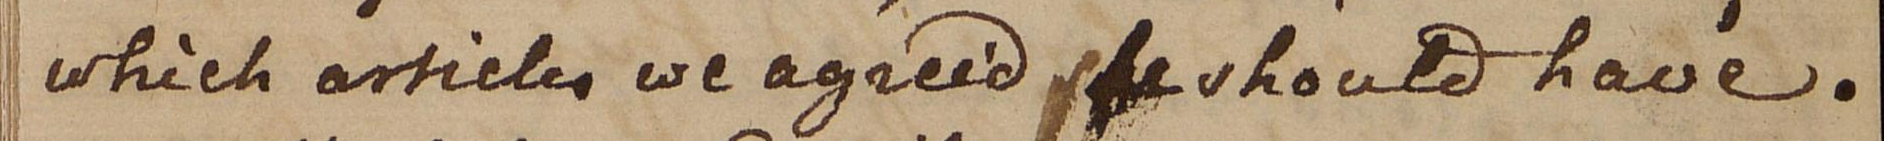which articles we agree'd she should have.
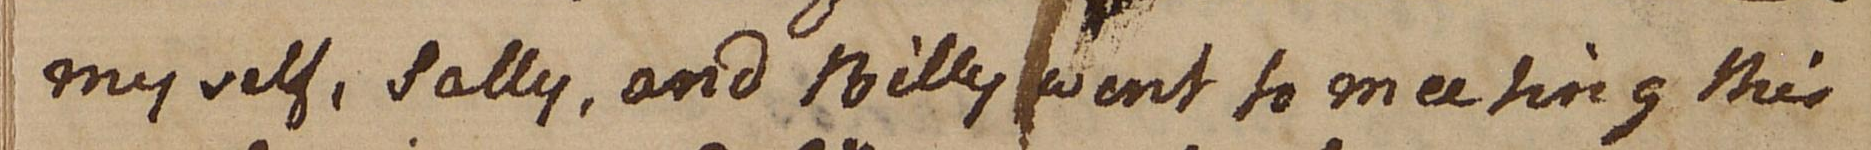my self, Sally, and Billy went to meeting this
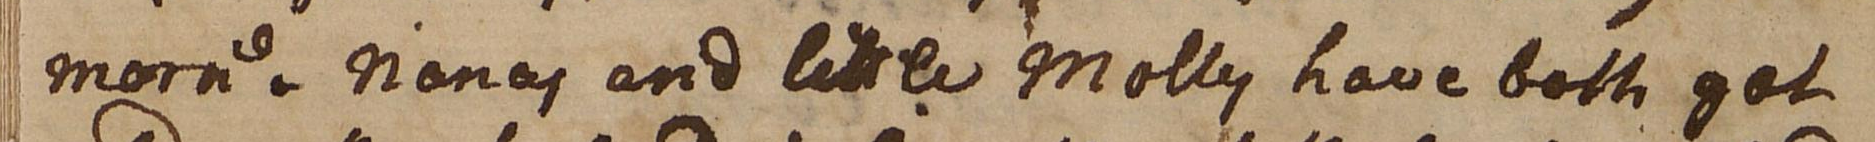morn^g. Nancy and little Molly have both got
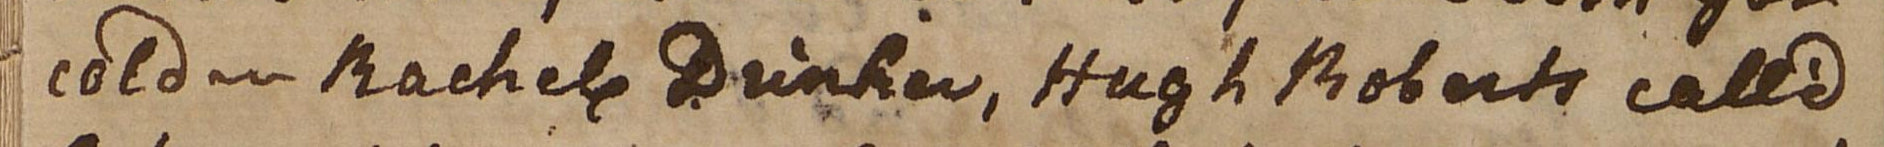cold- Rachel Drinker, Hugh Roberts call'd
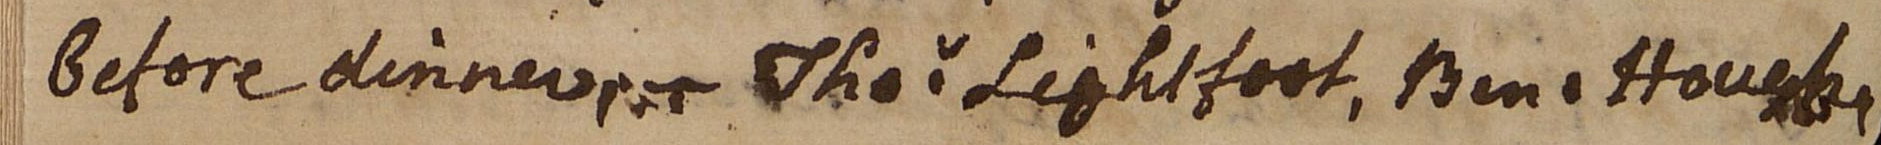before dinner;- Tho^s. Lightfoot, Bens Houek
